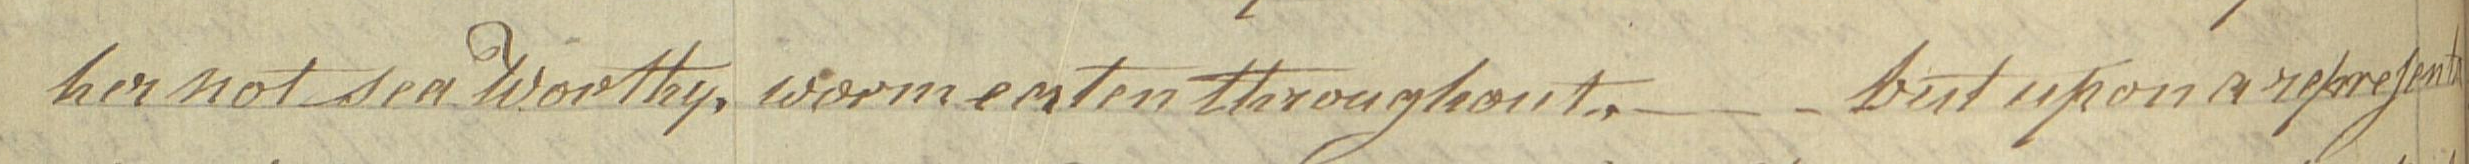her not sea Worthy, worm eaten throughout. but upon a represent-
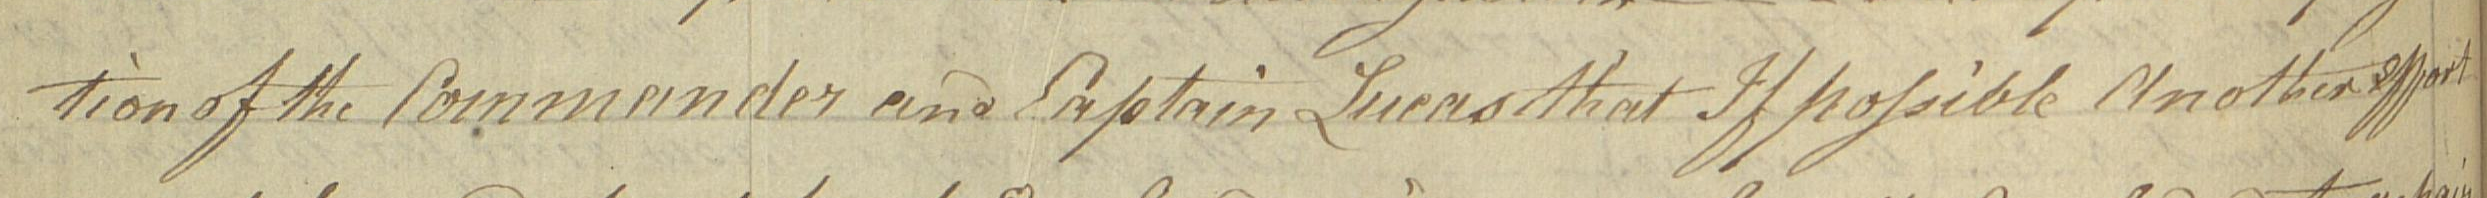-tion of the Commander and Captain Lucas that If possible Another Effort
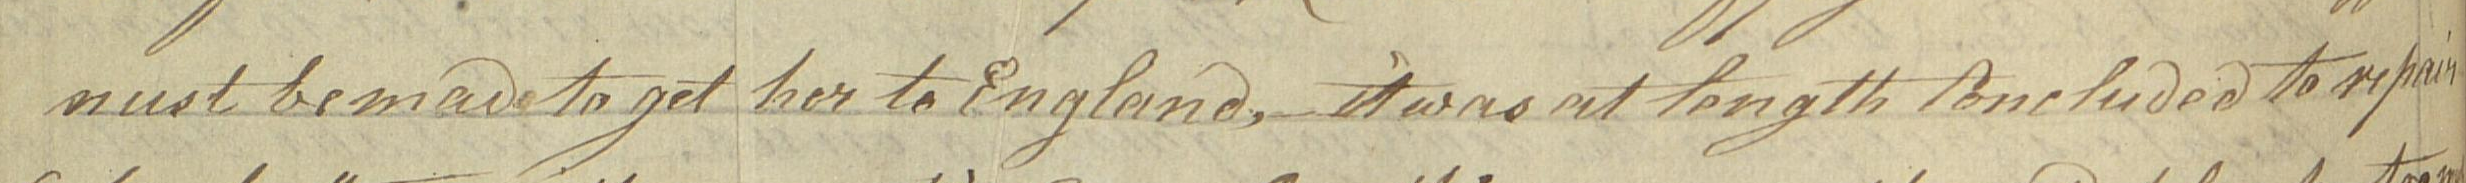must be made to get her to England, it was at length Concluded to repair
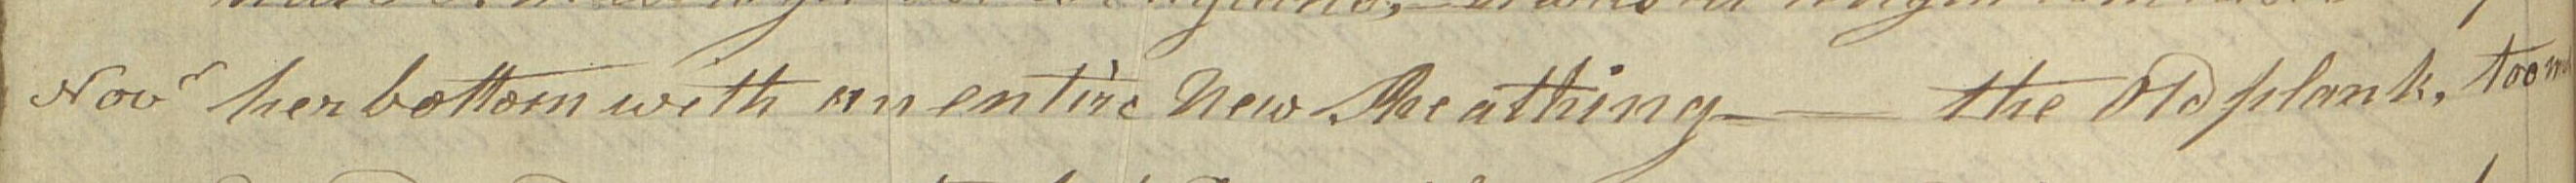Nov^r her bottom with an entire New Reathing the old plank, too m-
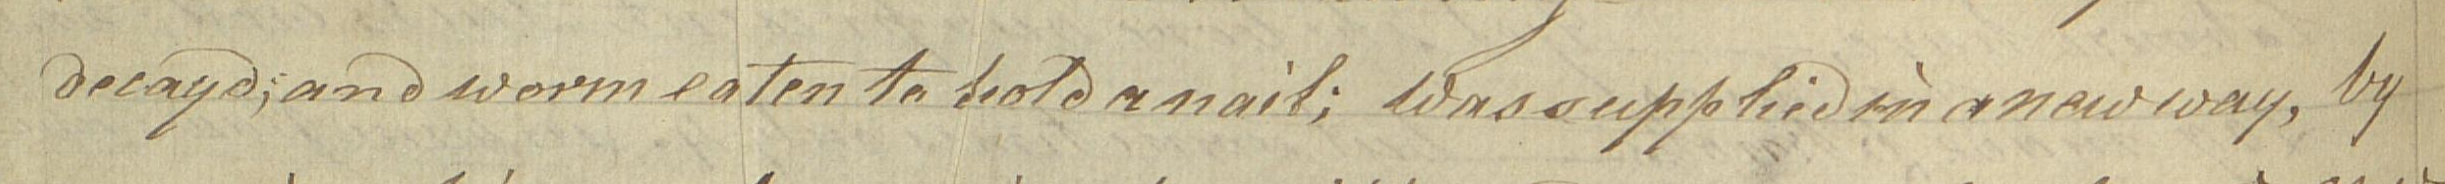decayd; and worm eaten to bold a nail; was supplied in a now way, by
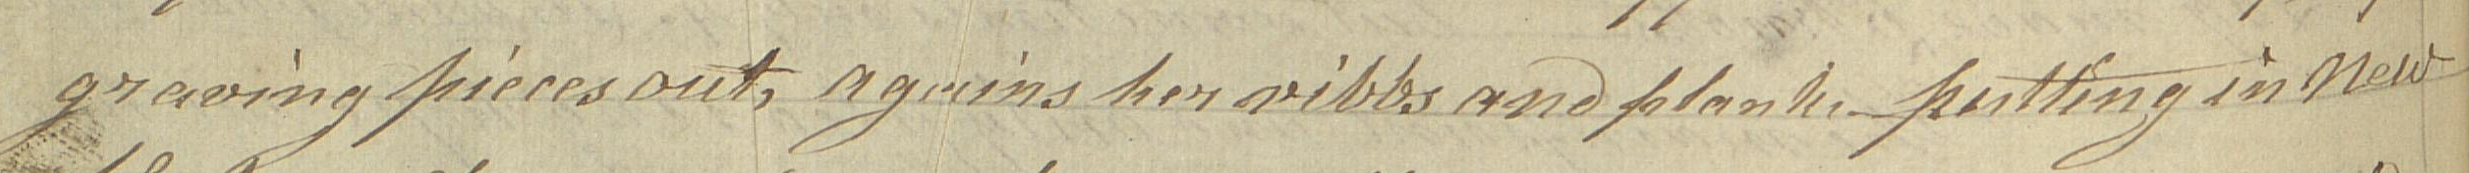graving pieces out, agains her ribbs and plank putting in New
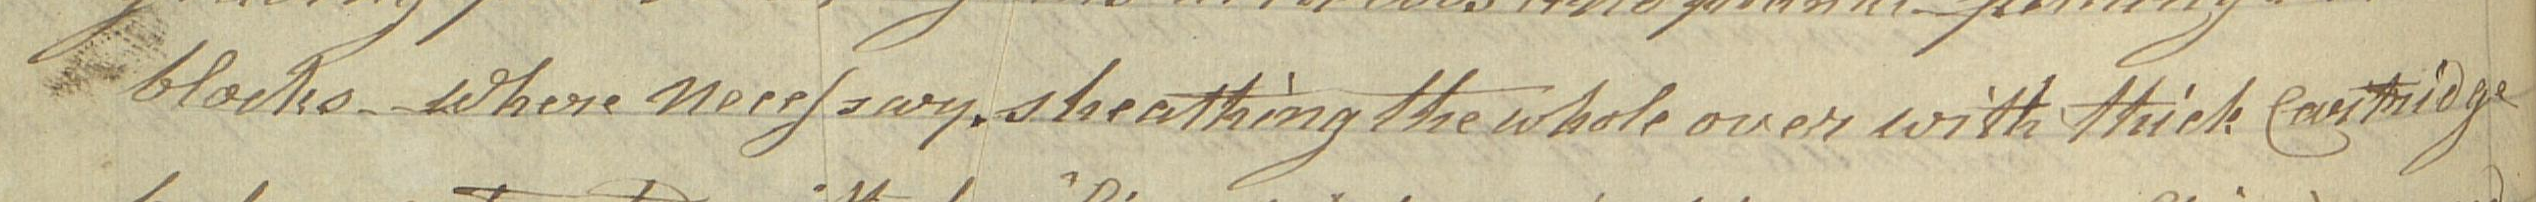blocks Where necessary sheathing the whole over with thick Cartridge
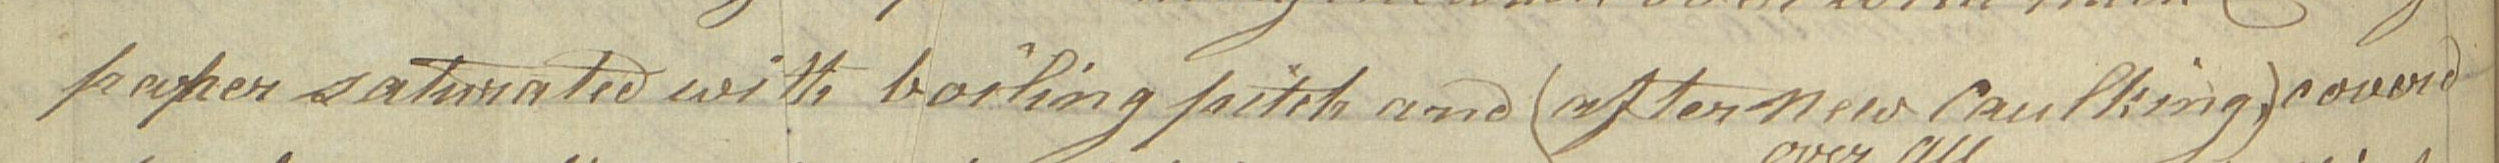paper saturated with boiling pitch and (after new Caulking) coverd
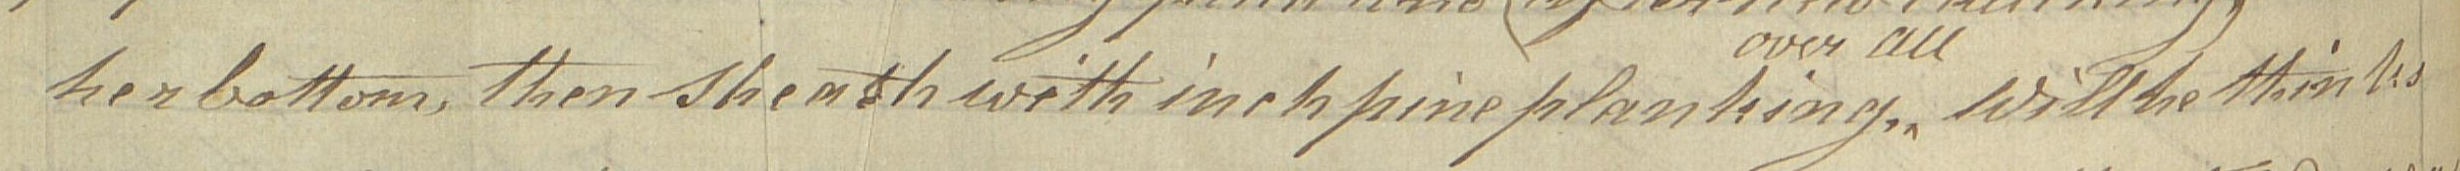her bottom then sheath with inch pine planking, ^ Will he thinks
